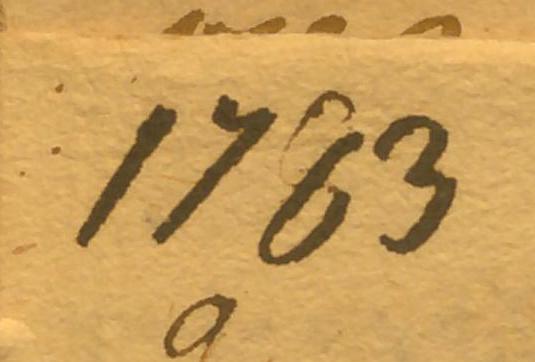1783
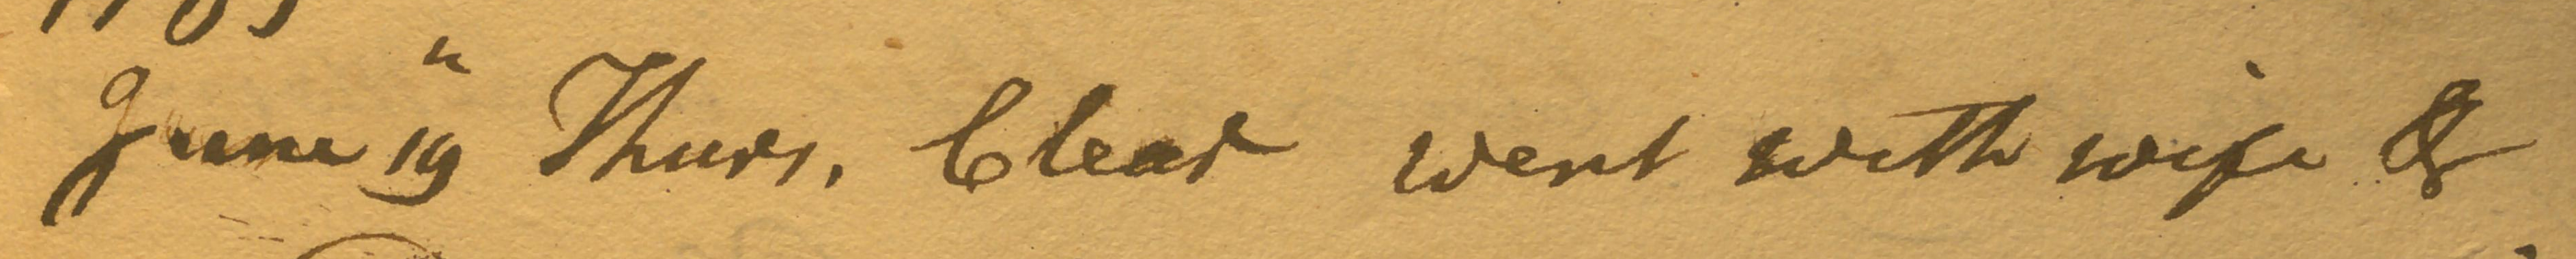June 19^th Thurs. Clear went with wife &
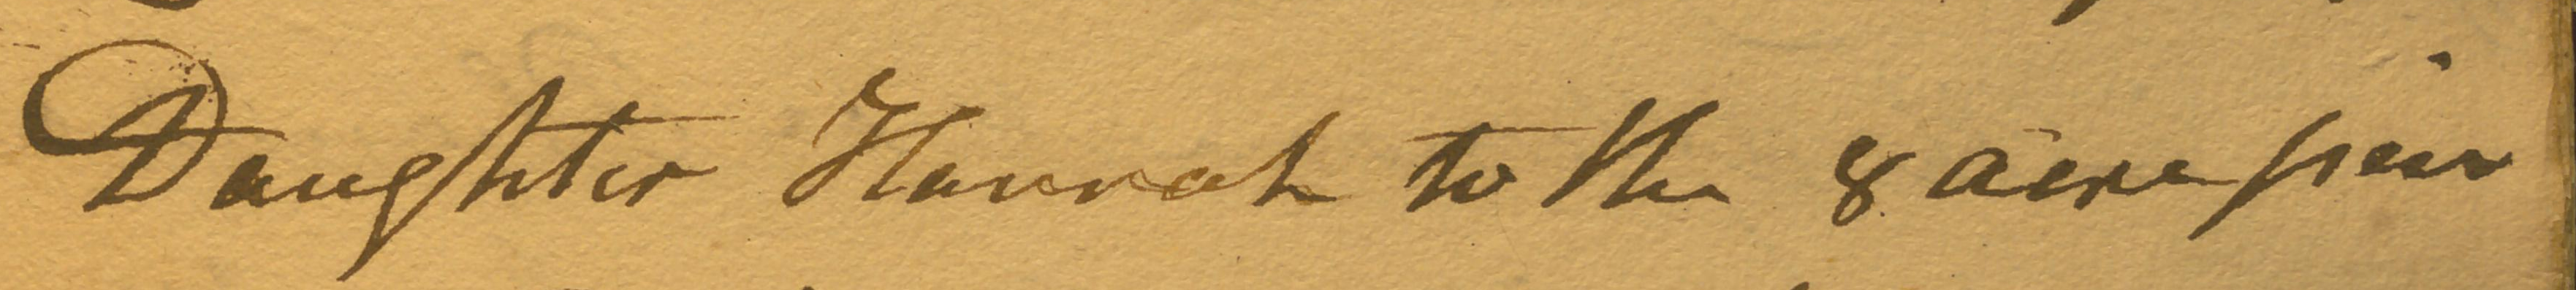Daughter Hannah to the 8 acre pice
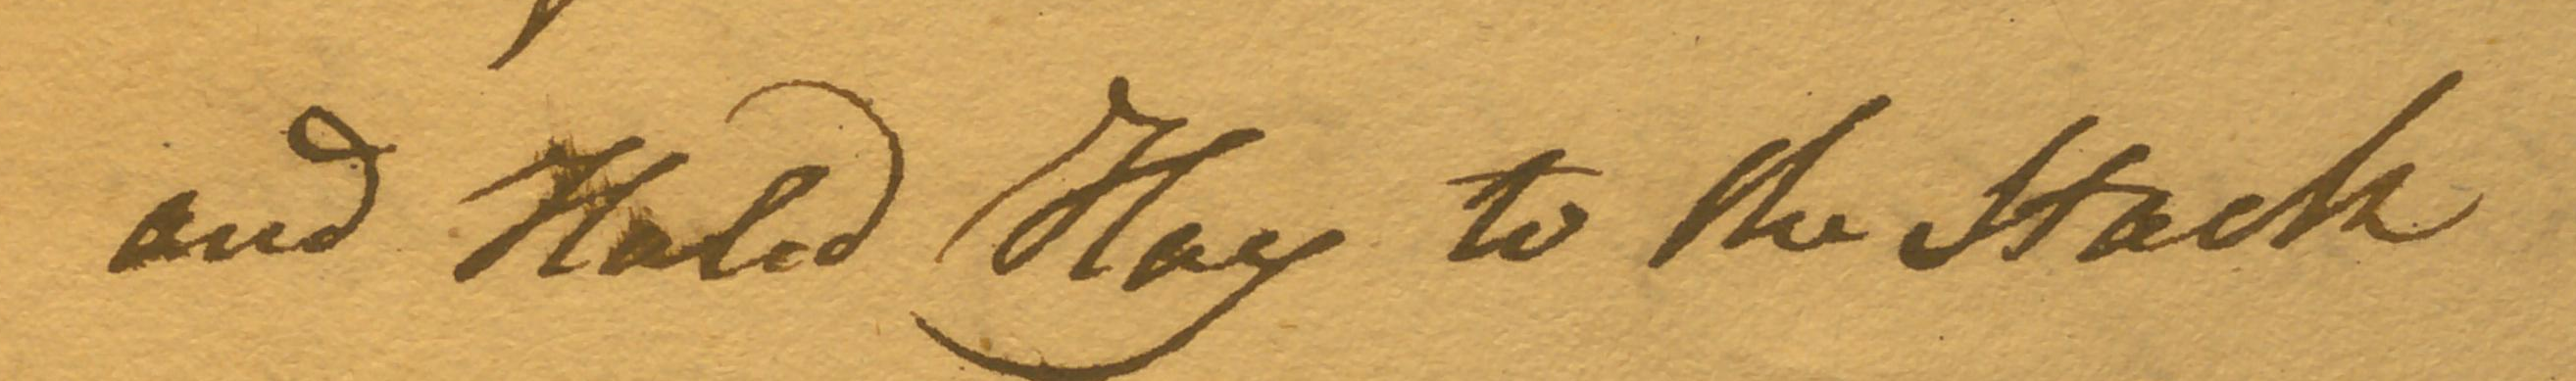and Haled Hay to the Stack
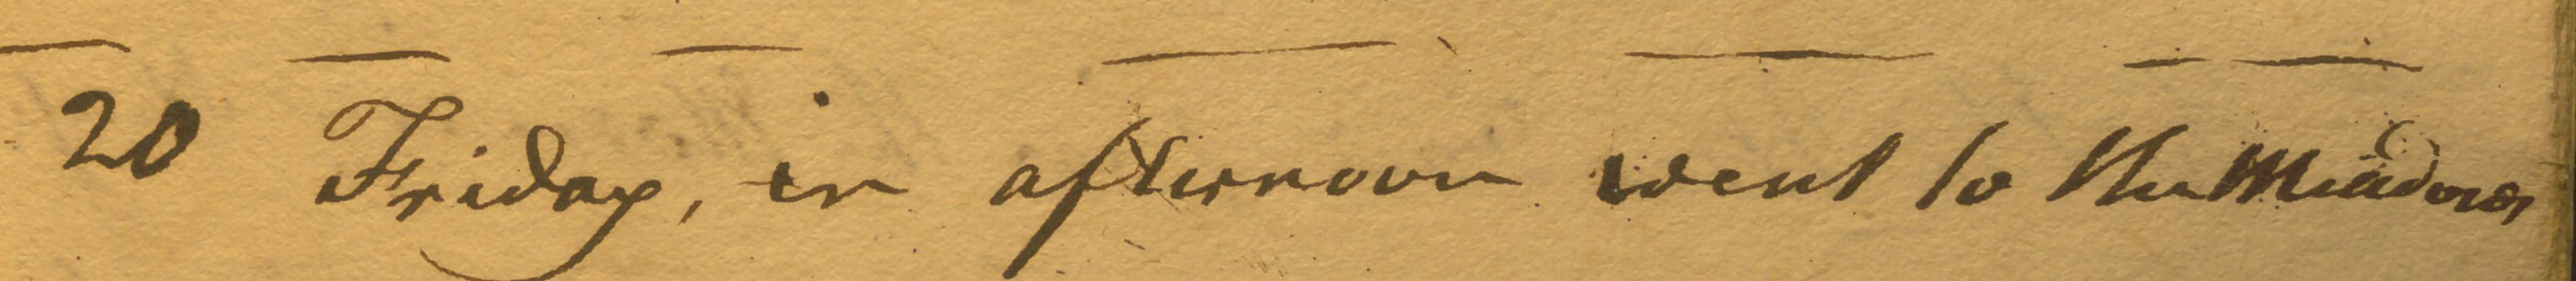20 Friday, in afternoon went to the Meadows
